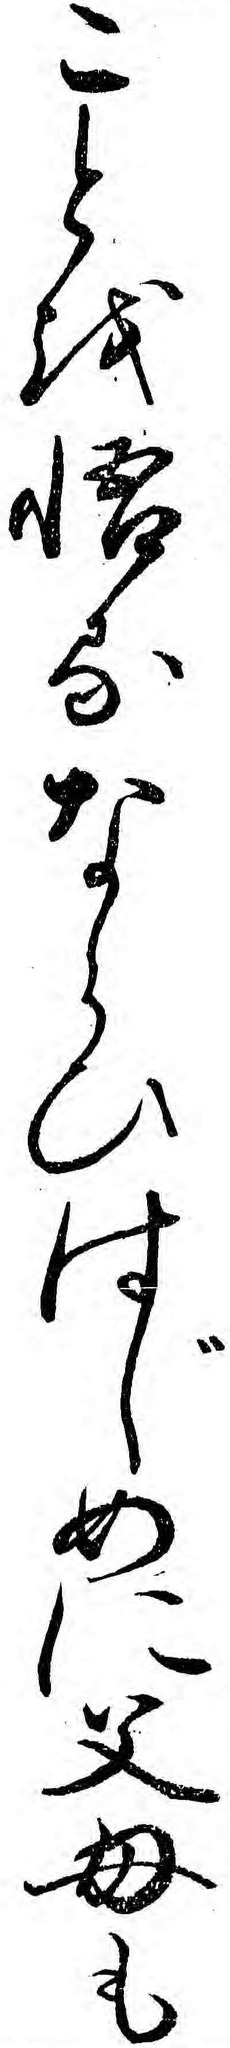ことを悟るならひはじめに父母も
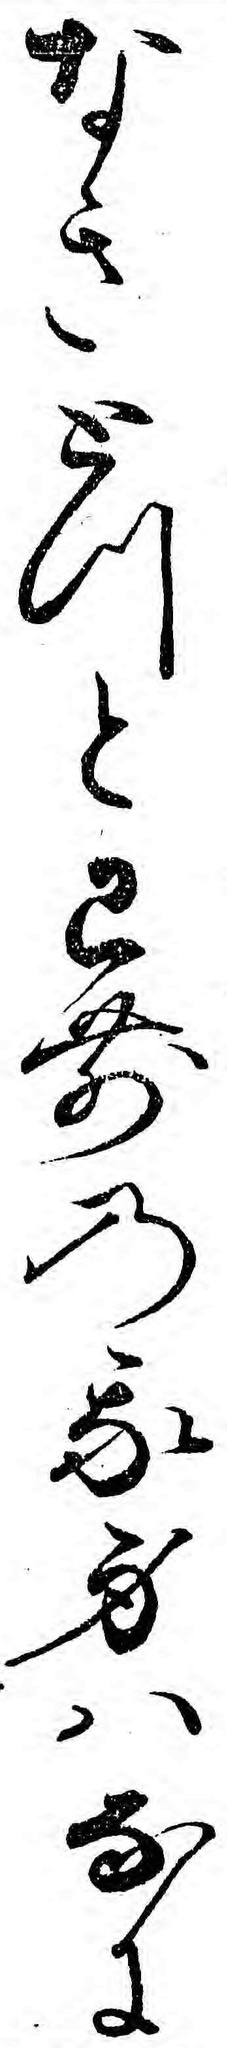なきとつと已前の我身はなに
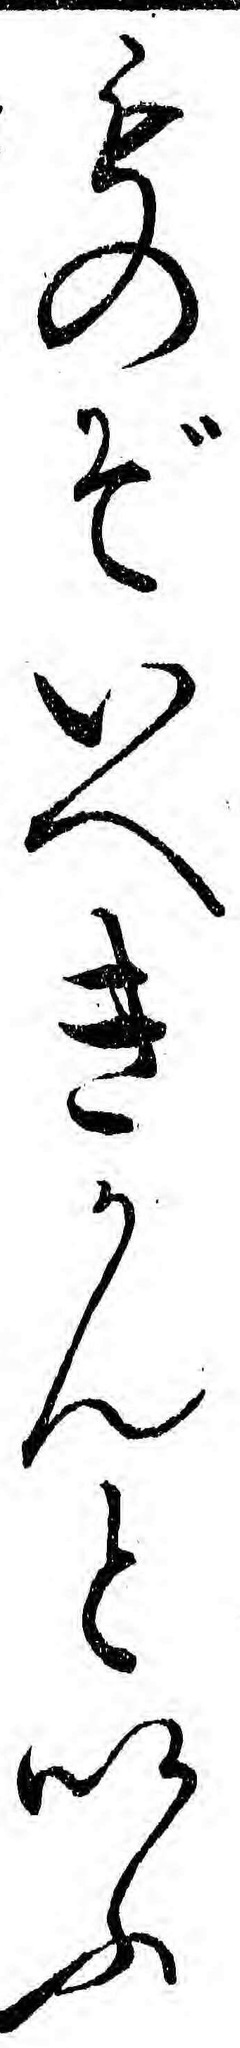ものぞいへきかんといふ
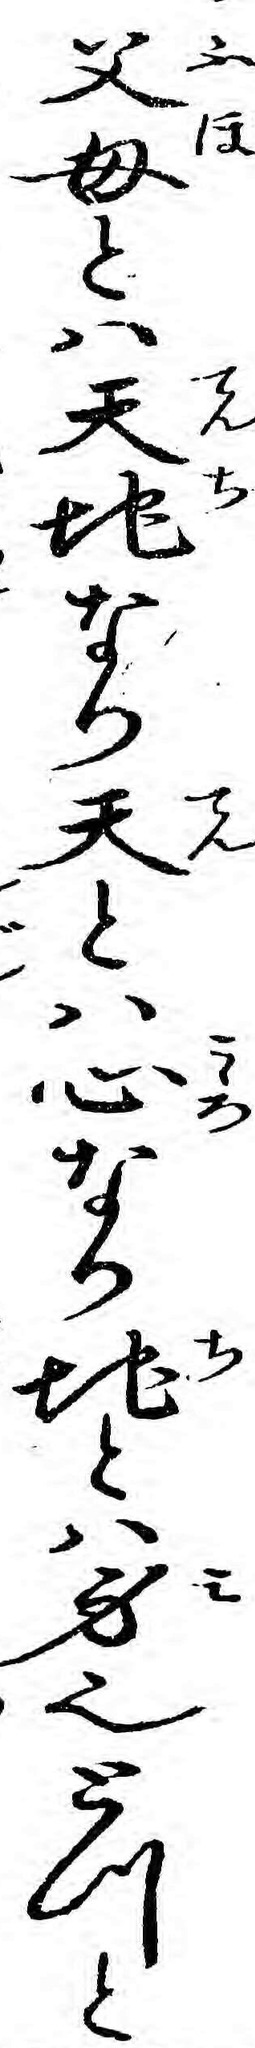父母とは天地なり天とは心なり地とは身也とつと
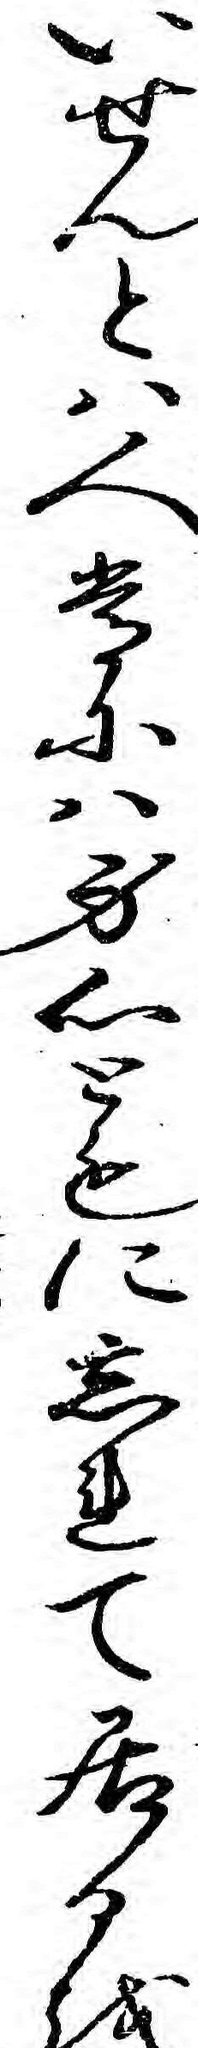いぜんとは人常には身心ともに忘れて居るを
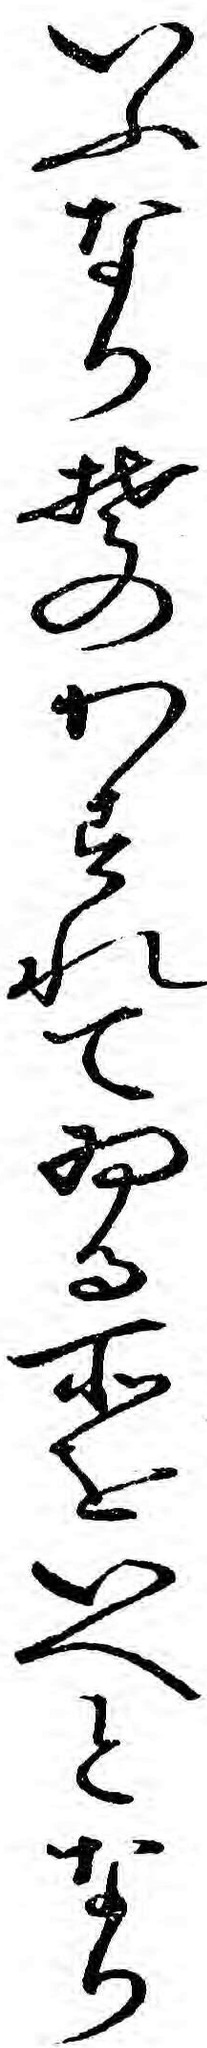いふなりそのわすれてゐる所をいへとなり
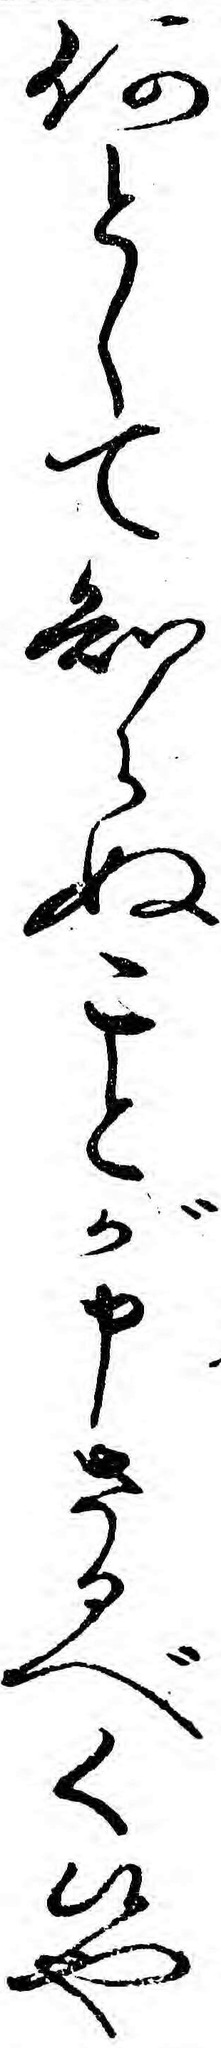何として知らぬことが申さるべく候や
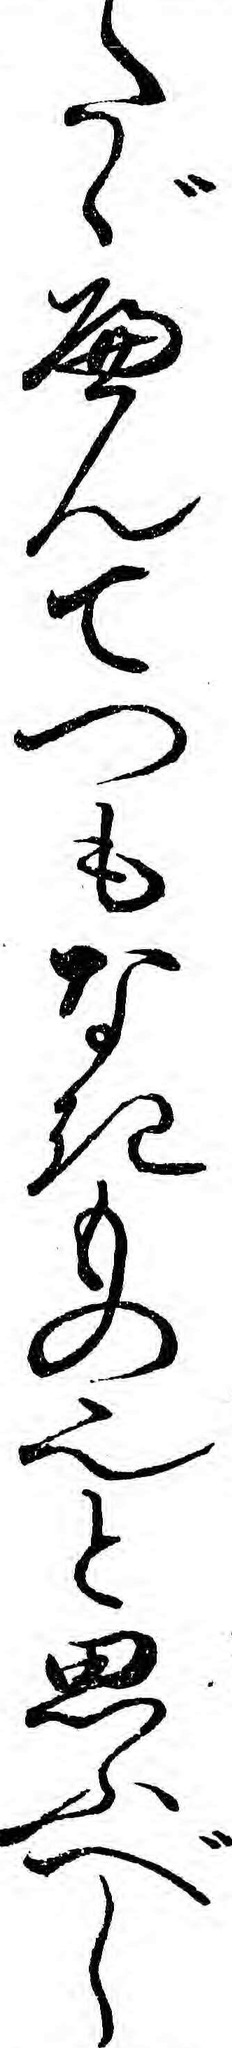たゞへんてつもなきもの也と思ふべし
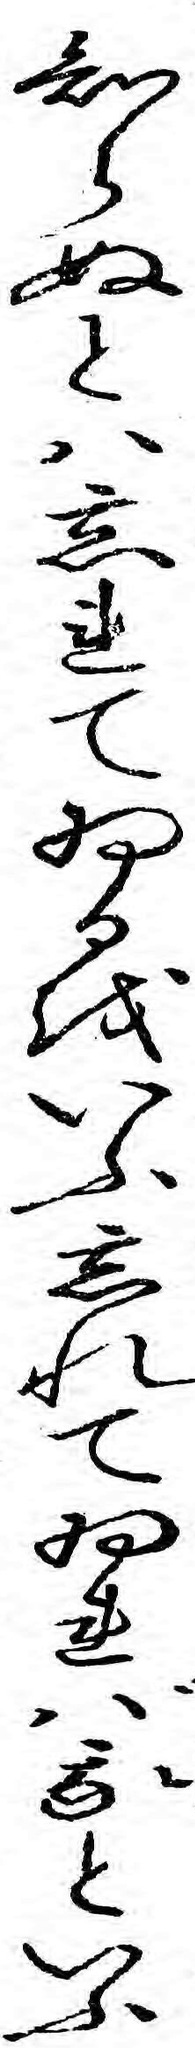知らぬとは忘れてゐるをいふ忘れてゐれば我といふ
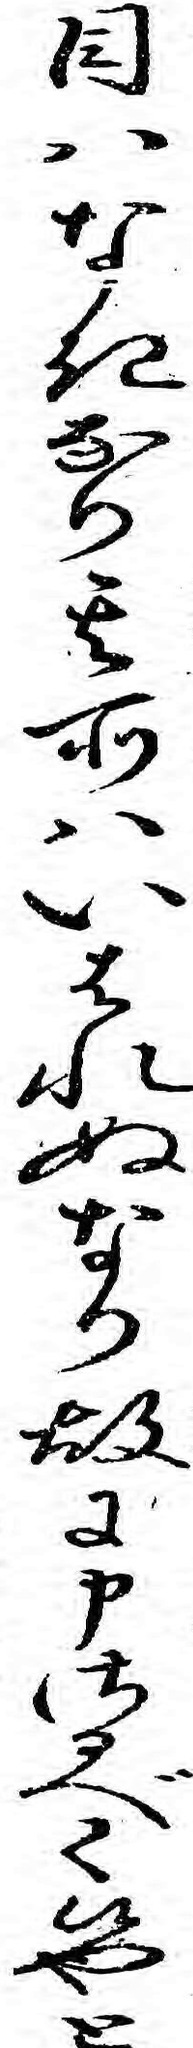目はなきなり其所はいはれぬなり故に申さるべく候やと
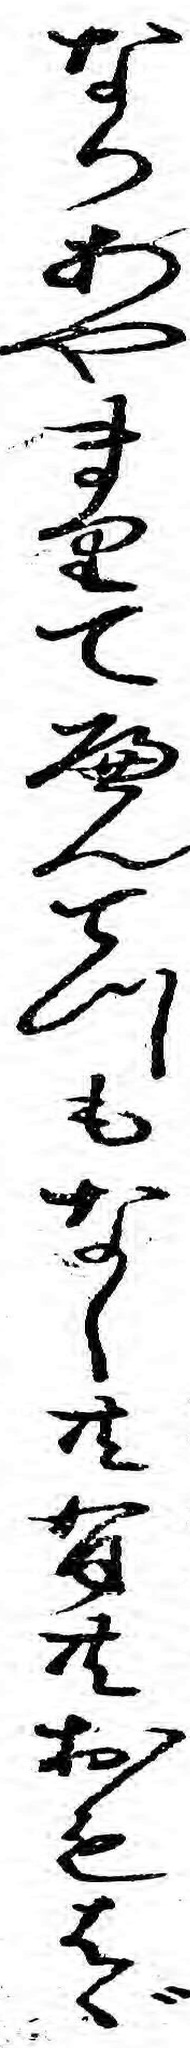なりあやまりてへんてつもなし共有共おもはゞ

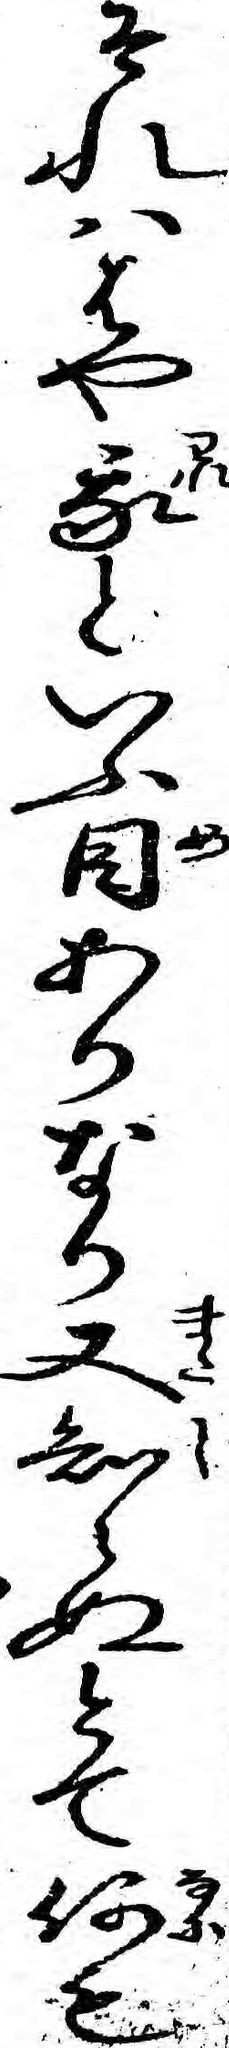それはや我といふ目ありなり又知らぬとて何も
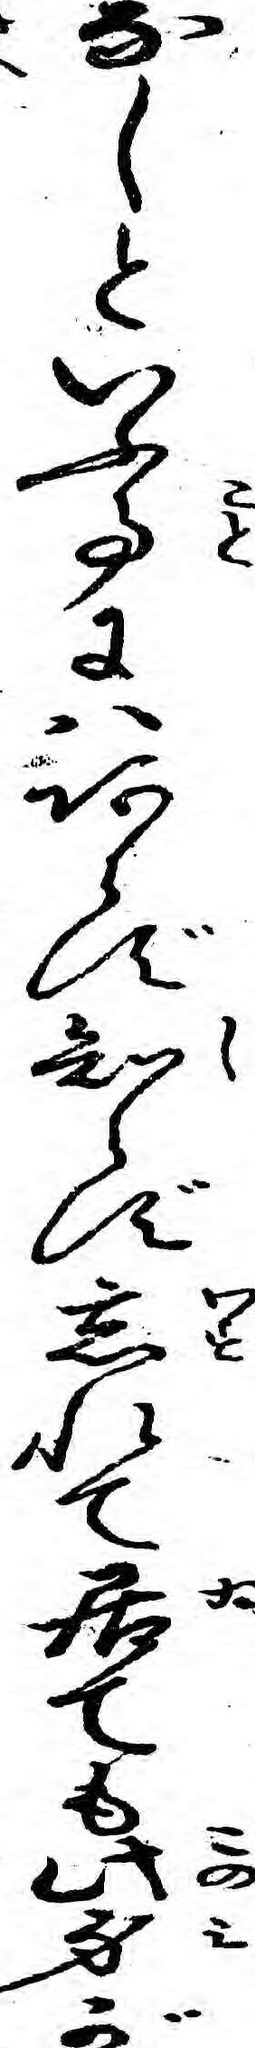なしといふ事にはあらず知らず忘れて居ても此身が
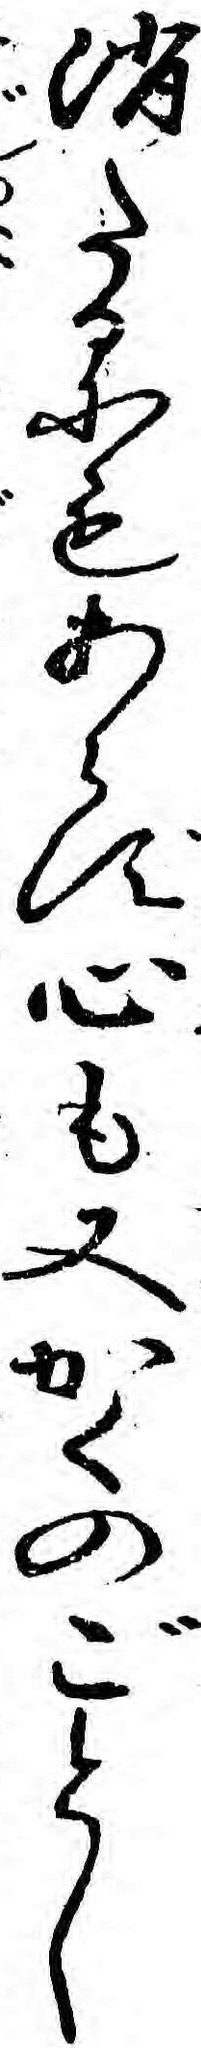消たるにもあらず心も又かくのごとし
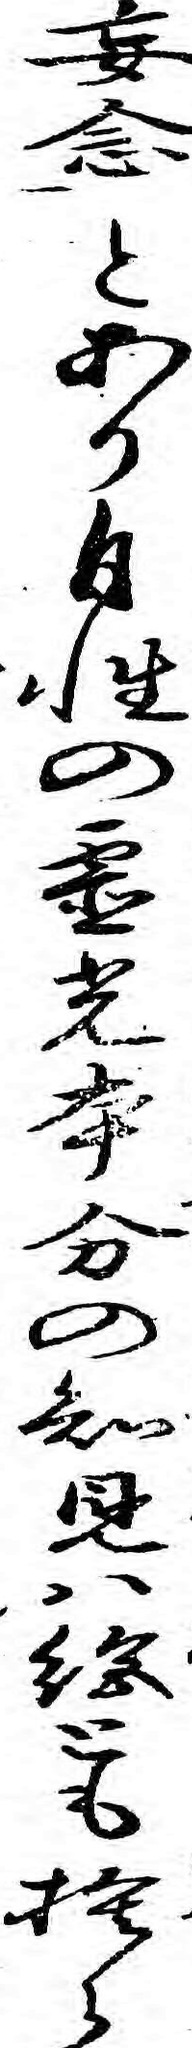妄念とあり自性の霊光本分の知見は絶とも捨ら
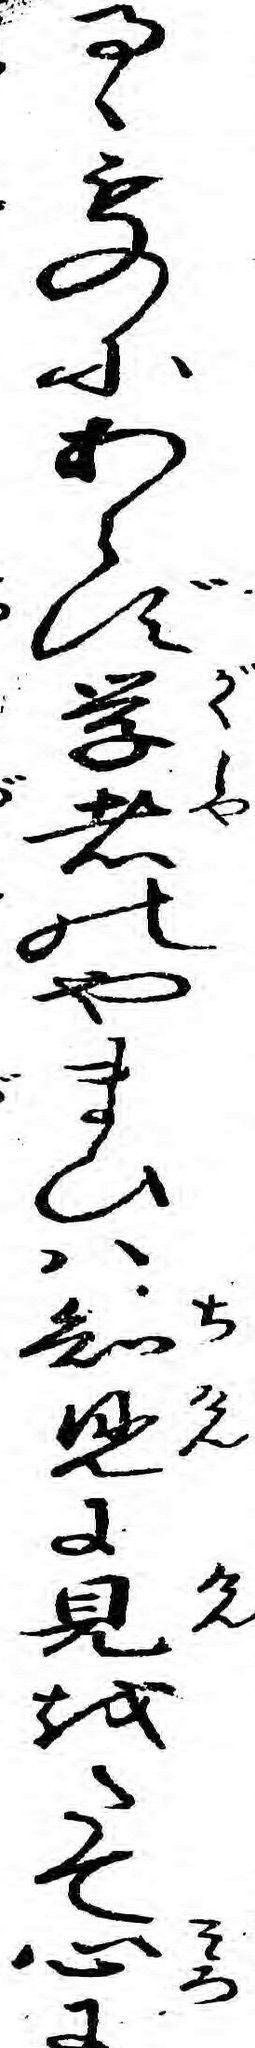るゝものにあらず学者のやまひは知見に見をたて心に
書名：目なし用心抄
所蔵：国文学研究資料館
